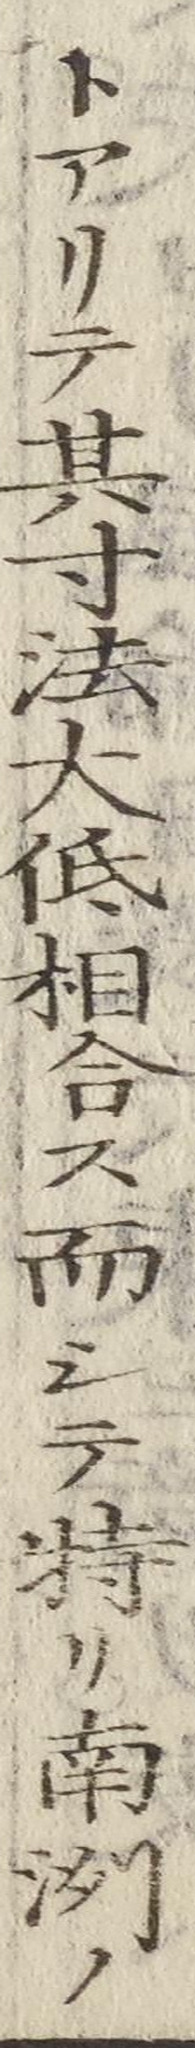トアリテ其寸法大低相合ス而シテ特リ南洌ノ
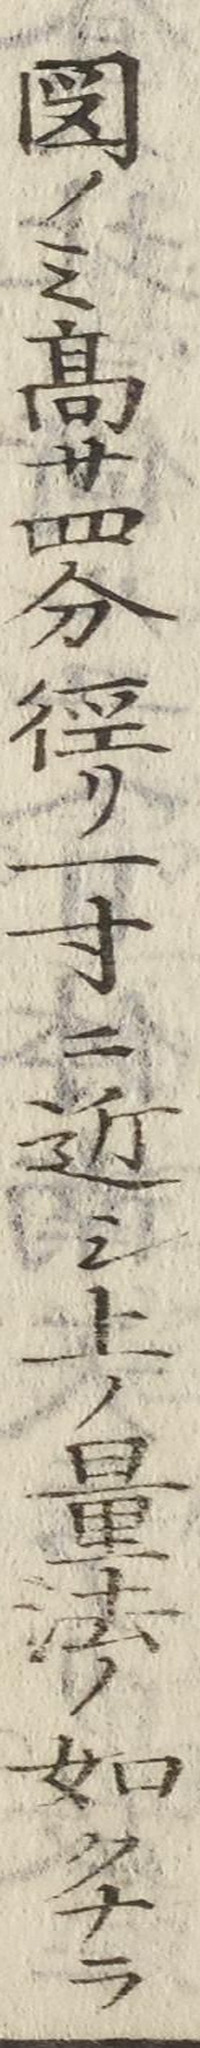図ノミ高サ四分径リ一寸ニ近シ上ノ量法ノ如クナラ
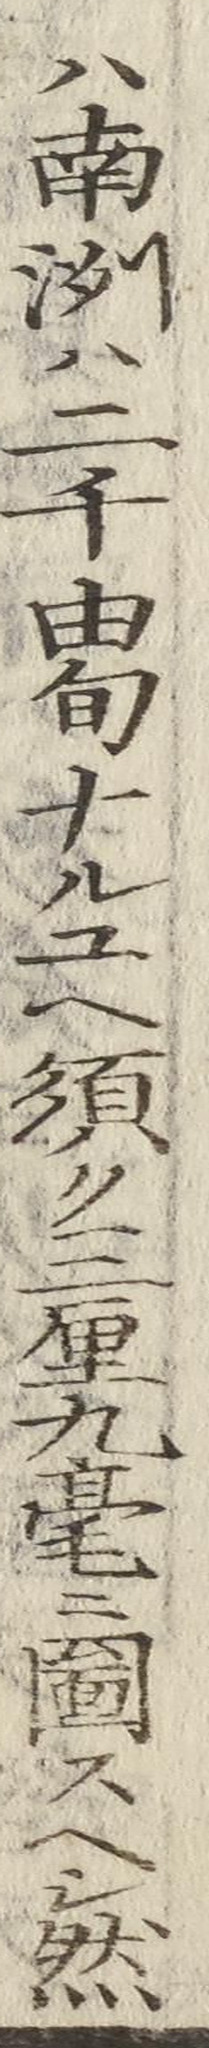ハ南洲ハニ千由旬ナルユヘ須ク三厘九毛ニ図スヘシ然
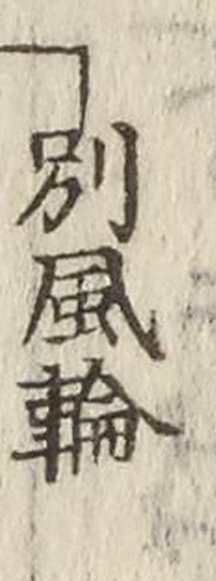別風輪
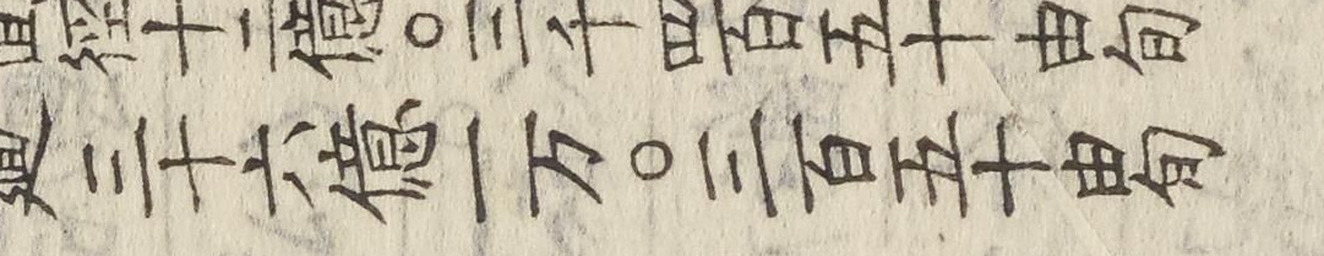周廻三十六億一万〇三百五十由旬
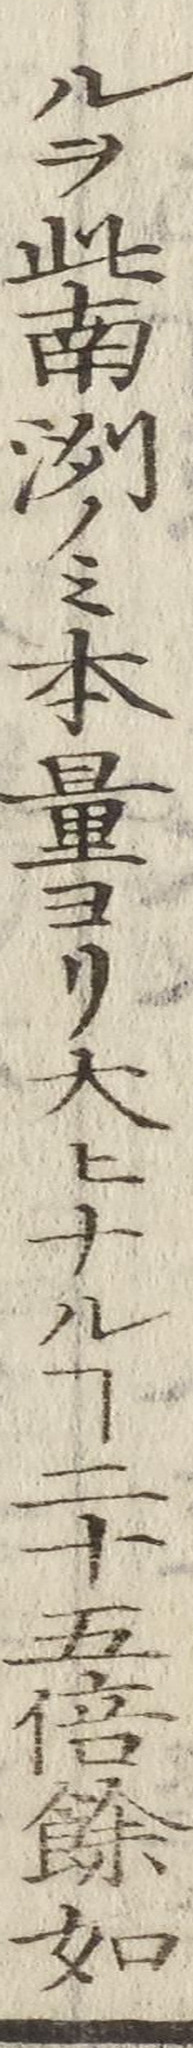ルヲ此南洲ノミ本量ヨリ大ヒナルコト二十五倍余如
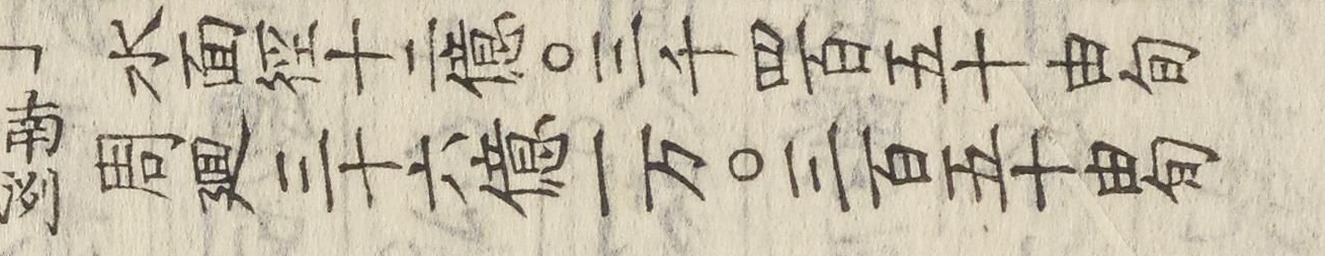周廻三十六億一万〇三百五十由旬
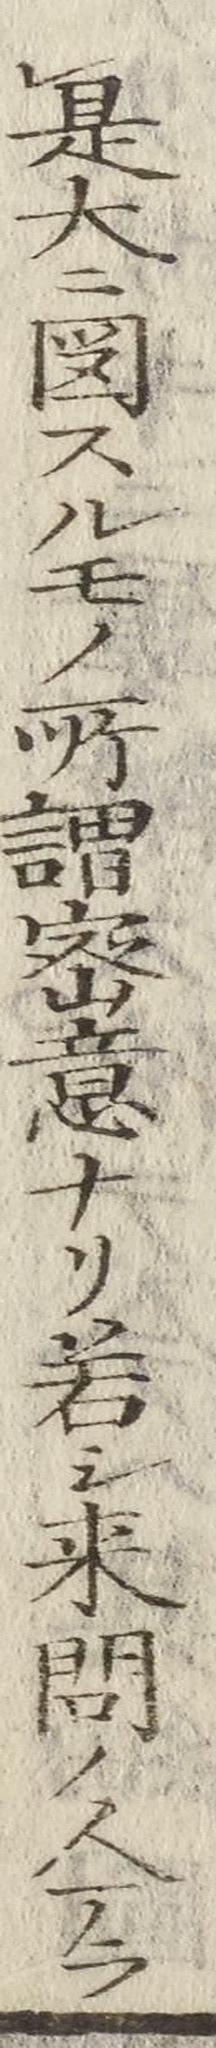是大ニ図スルモノ所謂蜜意ナリ若シ来問ノ人アラ
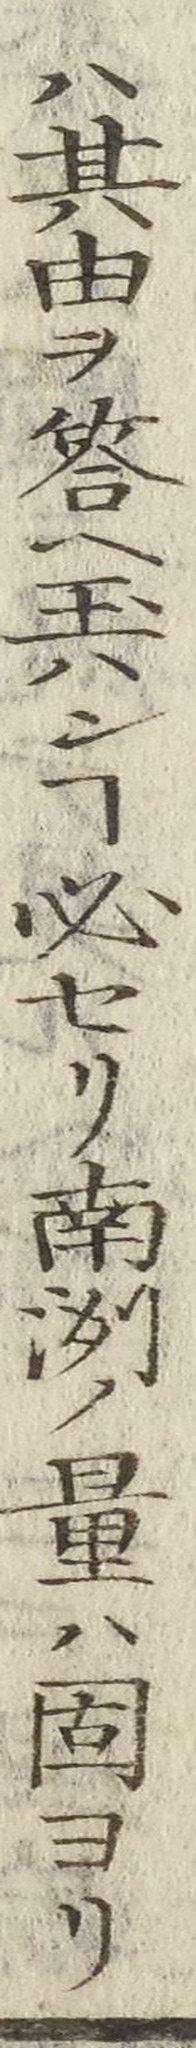ハ其由ヲ答ヘ玉ハンコト必セリ南洲ノ量ハ固ヨリ
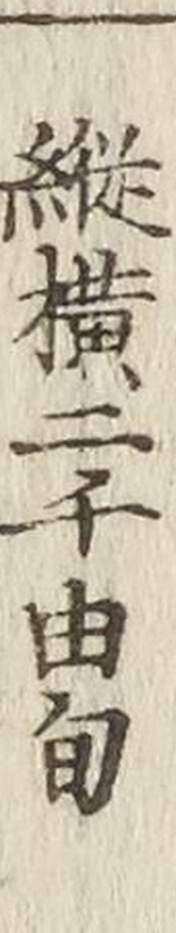縦横二千由旬
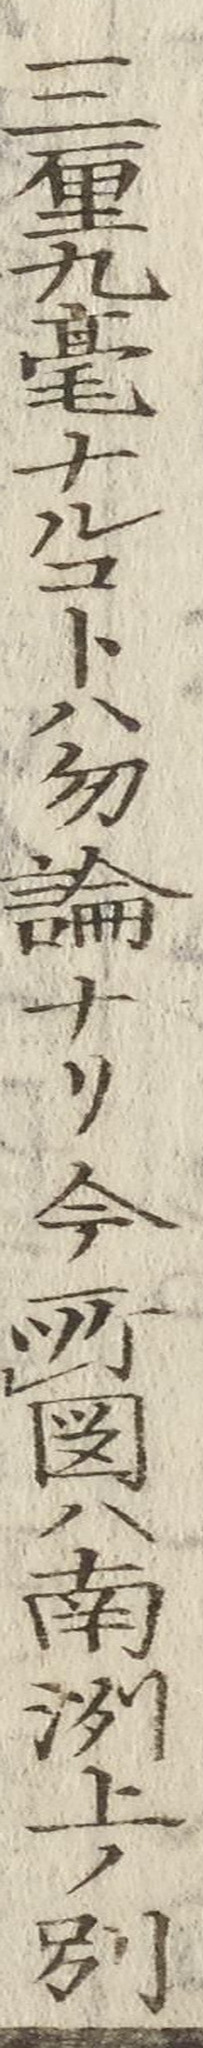三厘九毛ナルコトハ勿論ナリ今所図ハ南洲上ノ別
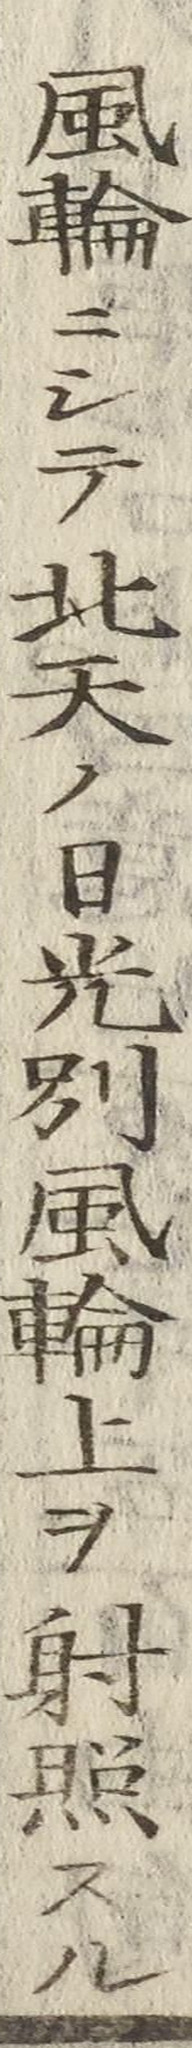風輪ニシテ北天ノ日光別風輪上ヲ射照スル
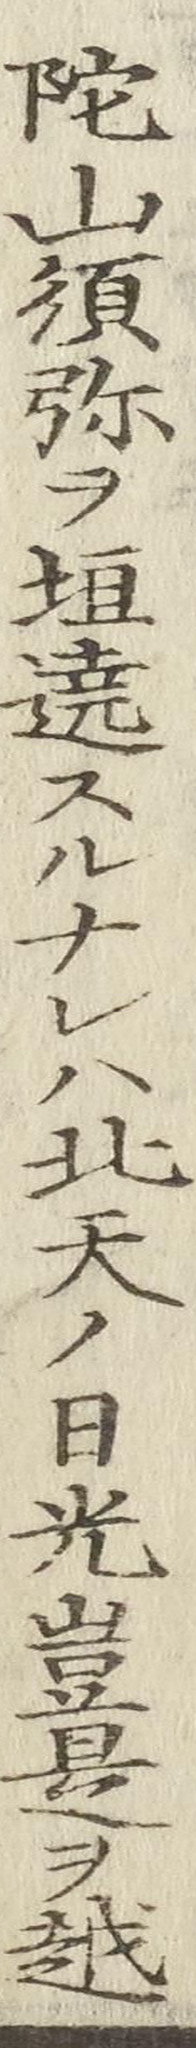陀山須弥ヲ垣遶スルナレハ北天ノ日光豈是ヲ越
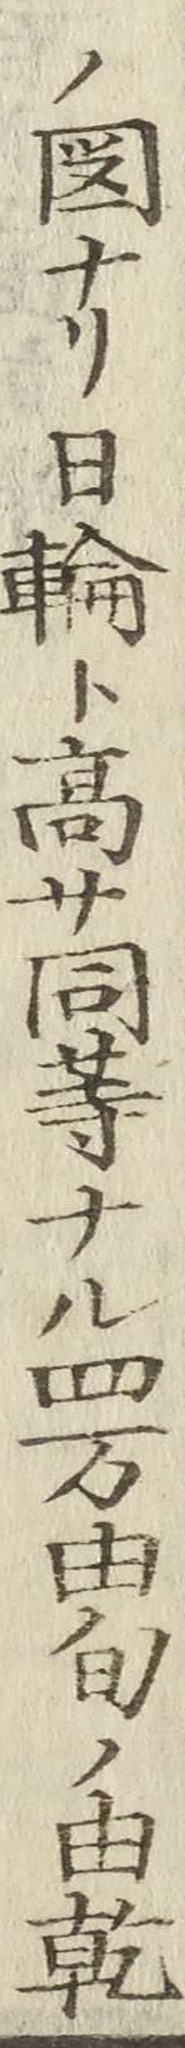ノ図ナリ日輪ト高サ同等ナル四万由旬ノ由乾
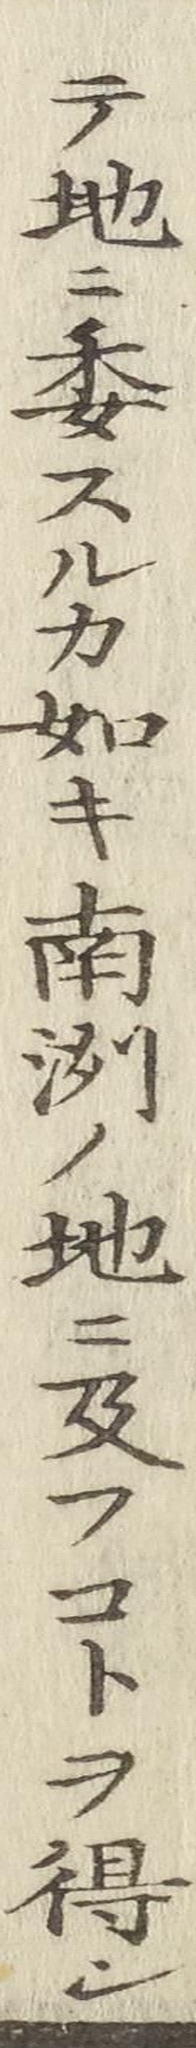テ地ニ委スルカ如キ南洲ノ地ニ及フコトヲ得ン
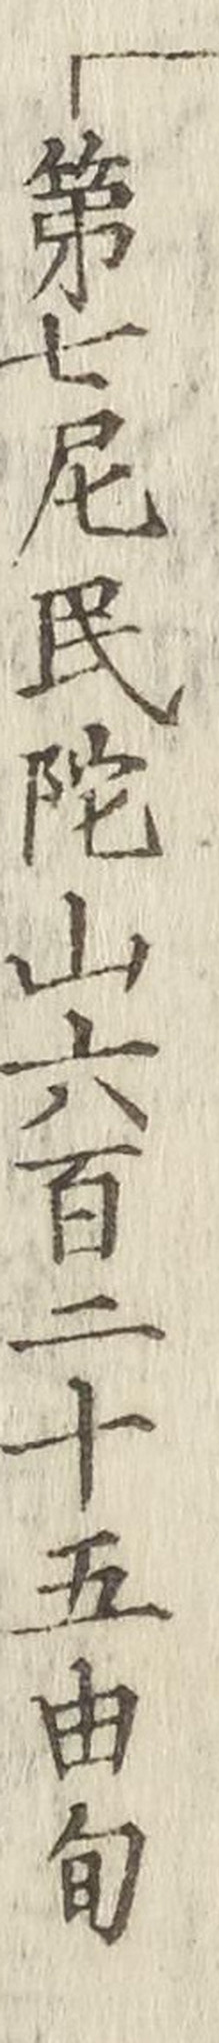第七尼民陀山六百二十五由旬
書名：護法新論　二編　上
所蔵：東京大学地震研究所図書室 Earthquake Research Institute Library, The University of Tokyo, JAPAN
